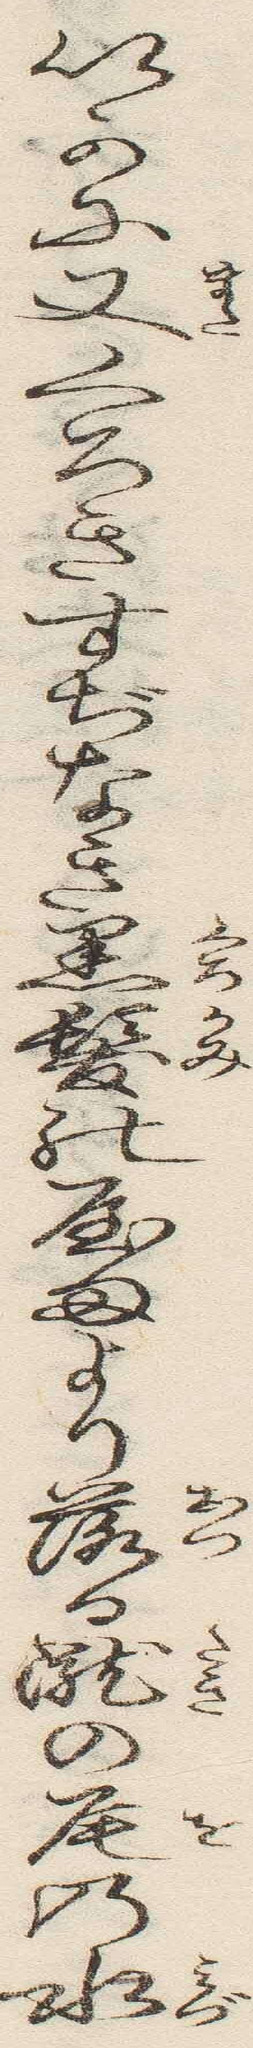いかに又くろきすぢなき黒髪のやまより落る瀧の尾の水
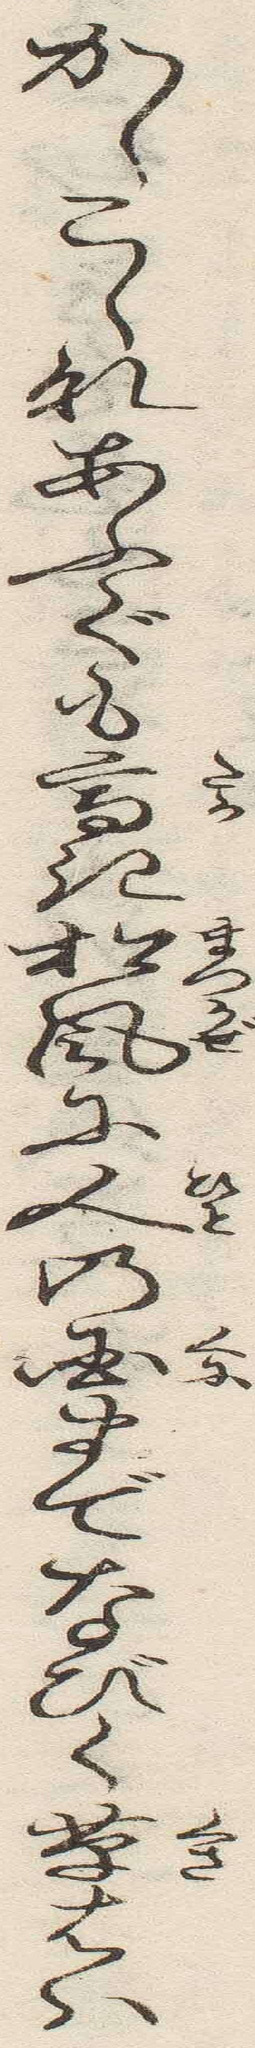かしこしれあふぐも高き松風に人の国までなびく草はは
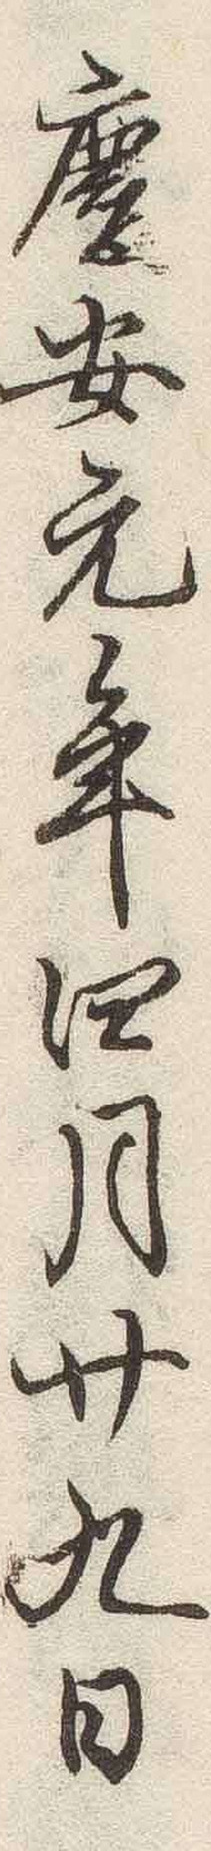慶安元年四月廿九日
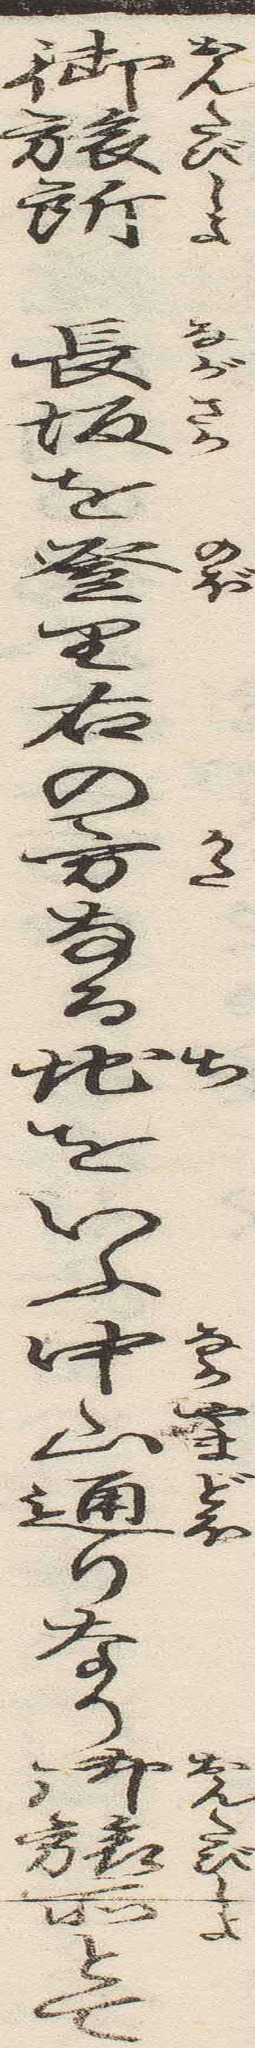御旅所長坂を登り右の方なる地をいふ中山通りなり御旅所とて
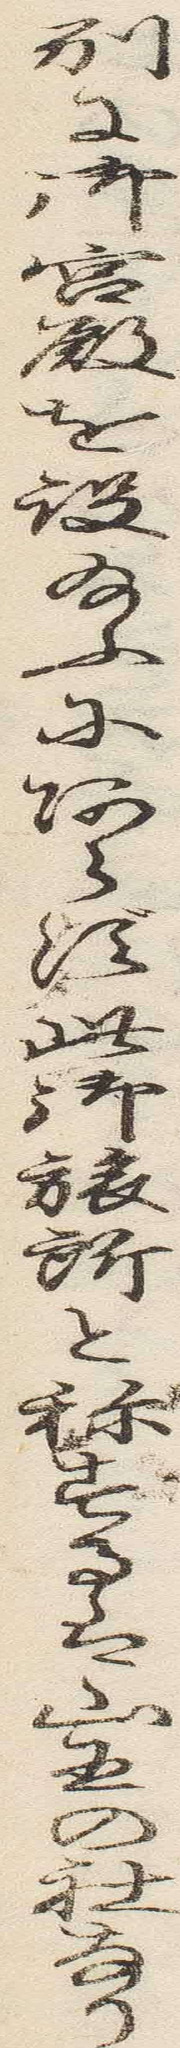別に御宮殿を設給ふにあらず此御旅所と称するは山王の社なり
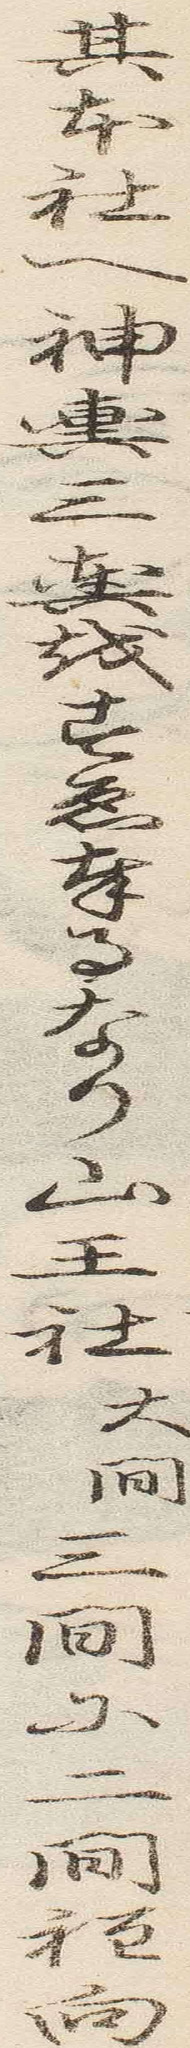其本社へ神輿三輿をすゑ奉るなり山王社大間三間に二間程向
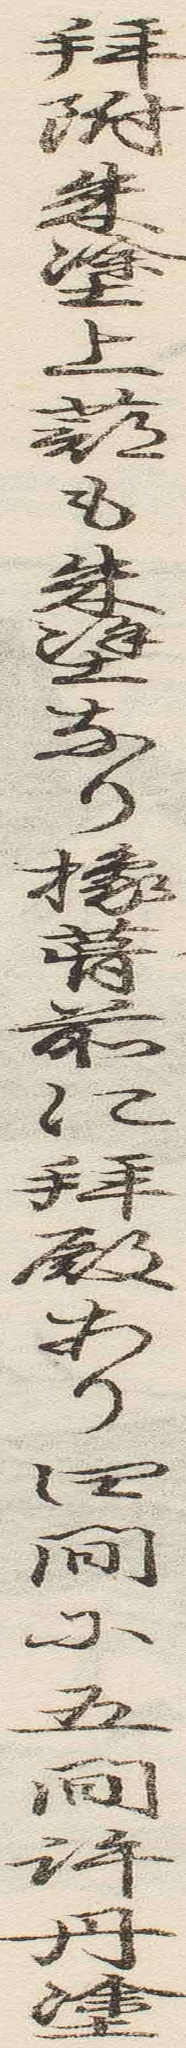拜附朱塗上蔀も朱塗なり橡葺前に拜殿あり四間に五間許丹塗
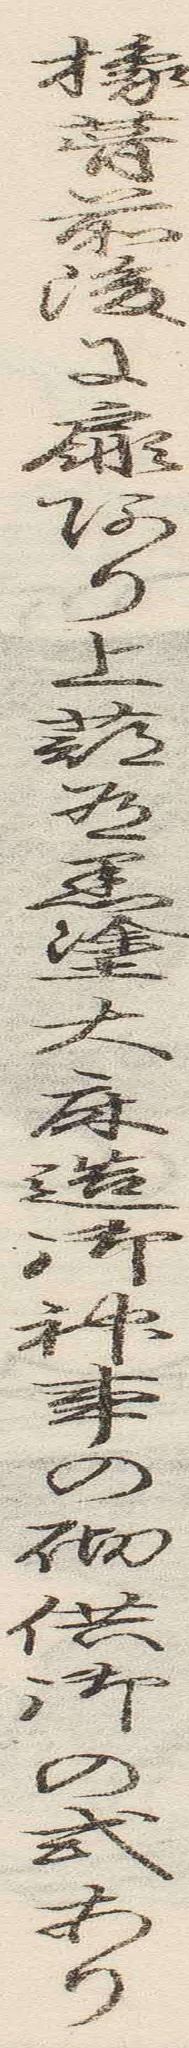橡葺前後に扉あり上蔀有黒塗大床造御神事の砌供御の式あり
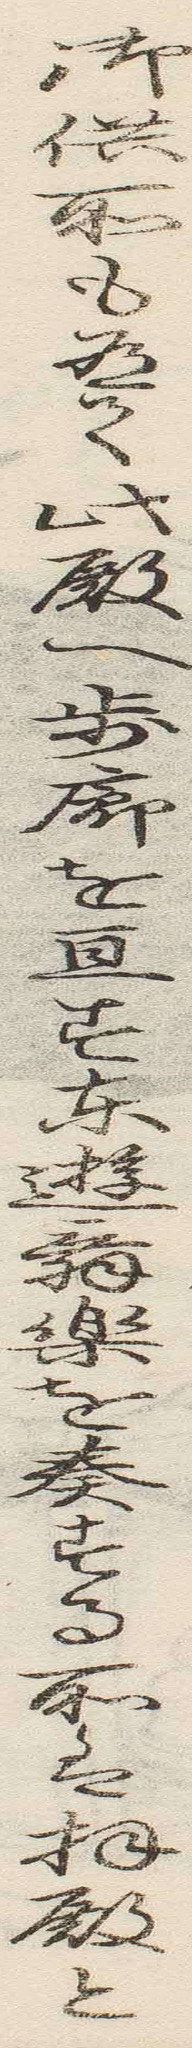御供所も有て此殿へ歩廊を亘す東逰舞樂を奏する所は拝殿と
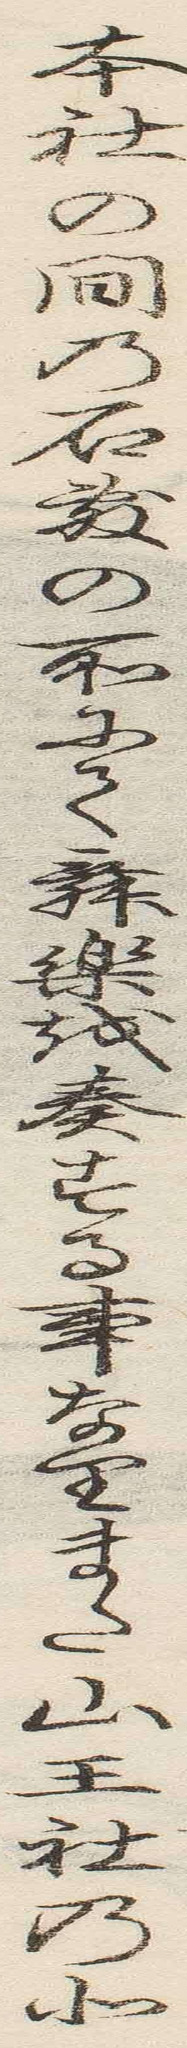本社の間の石敷の所にて舞樂を奏する事なりまた山王社の北
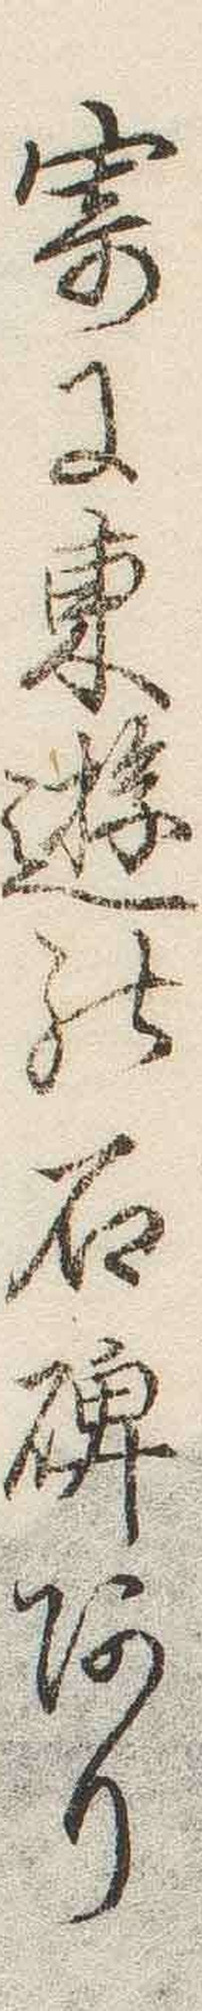寄に東逰の石碑あり
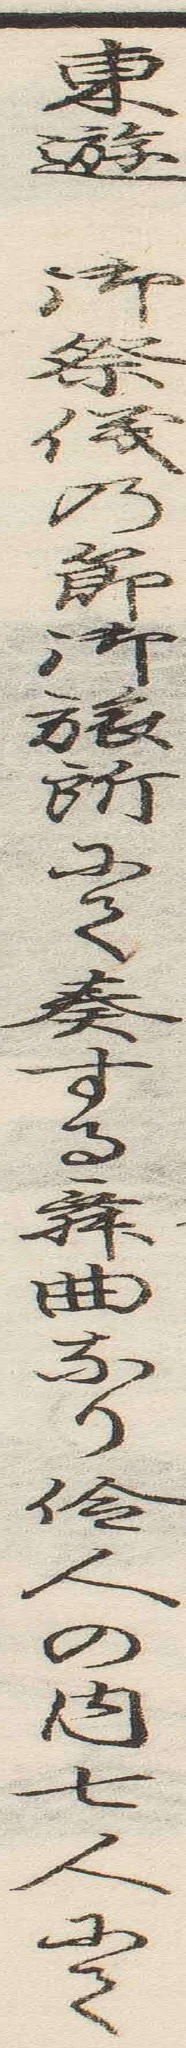東逰御祭儀の節御旅所にて奏する舞曲なり伶人の内七人にて
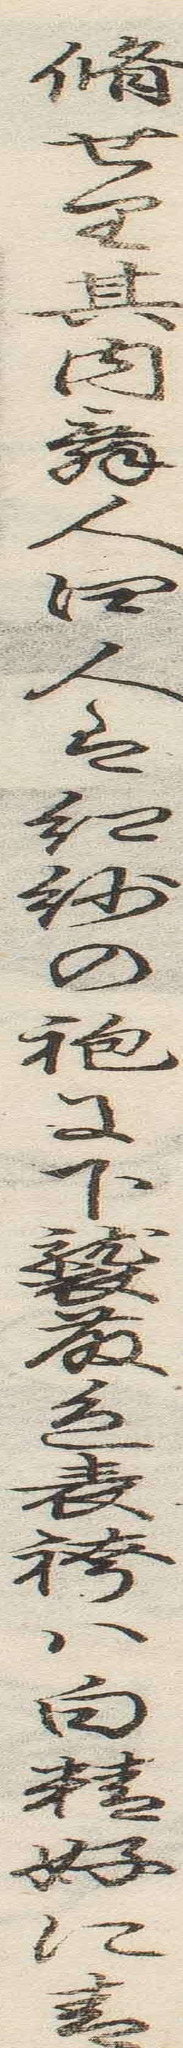脩せり其内舞人四人は紅紗の袍に下襲藤色表袴は白精好に青
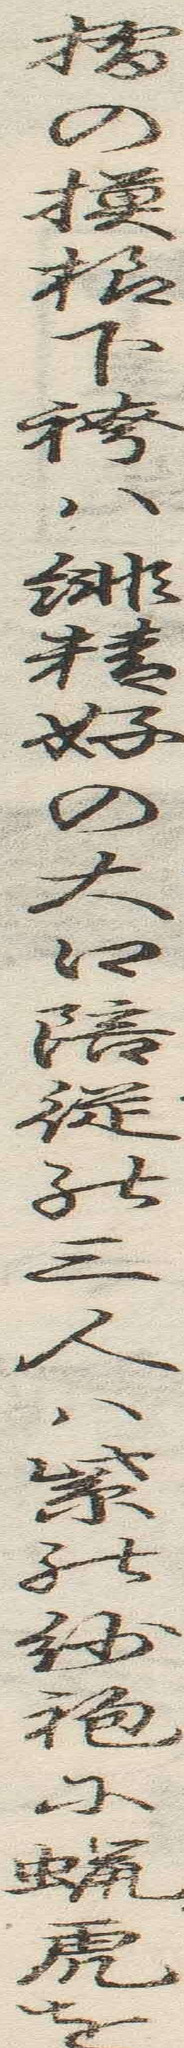摺の摸様下袴は緋精好の大口陪従の三人は紫の紗袍に蝋虎を
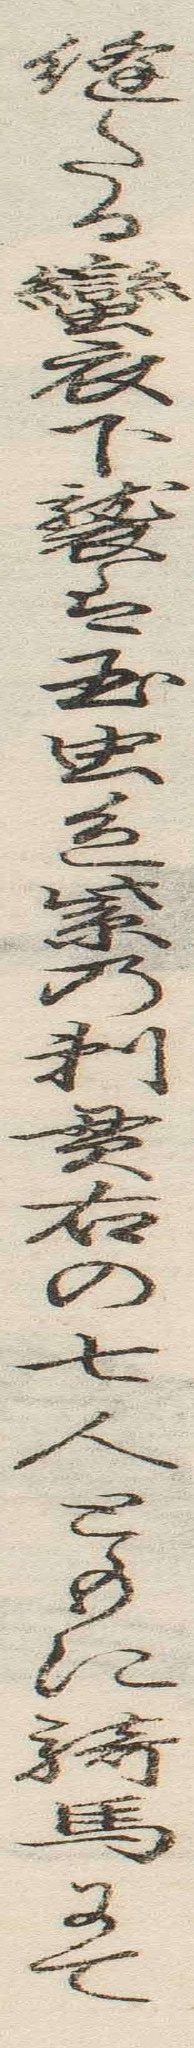縫たる蠻衣下襲は玉虫色紫の刺貫右の七人ともに騎馬にて
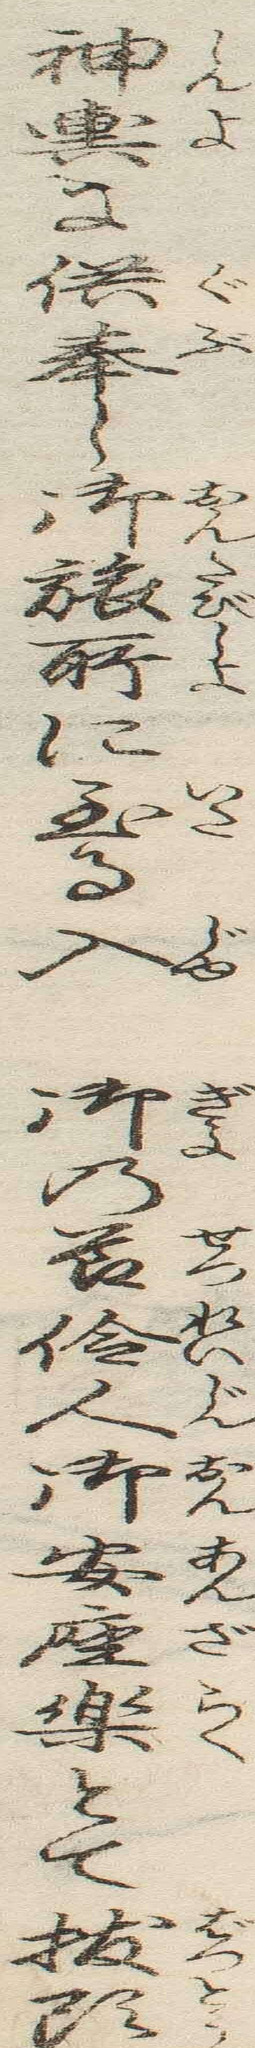神輿に供奉し御旅所に至る入御の節伶人御安座樂とて拔頭
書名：日光山志
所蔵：東京学芸大学附属図書館 国文学研究資料館
